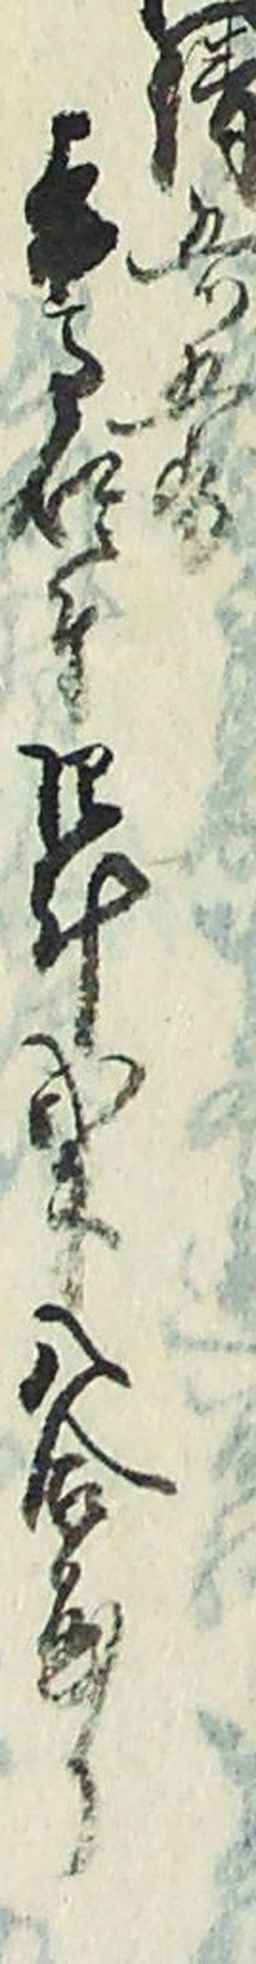表高石ニ付四斗弐升八合懸り
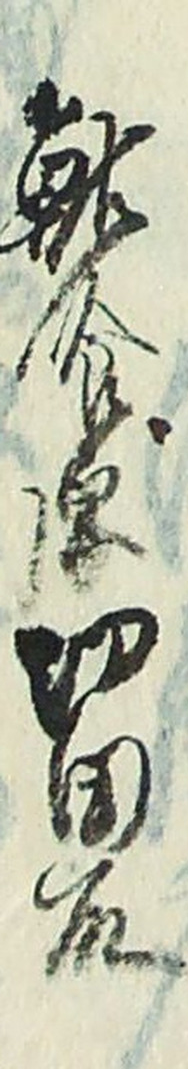鮎喰堺切田取
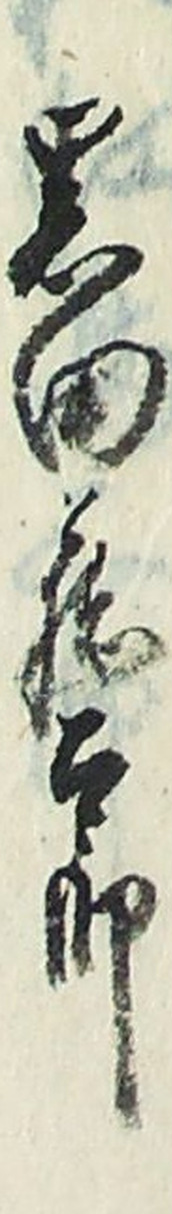岩田藤太郎

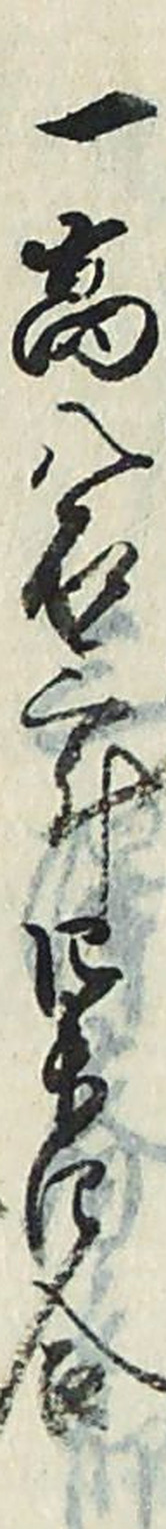一高八石三斗四升四合
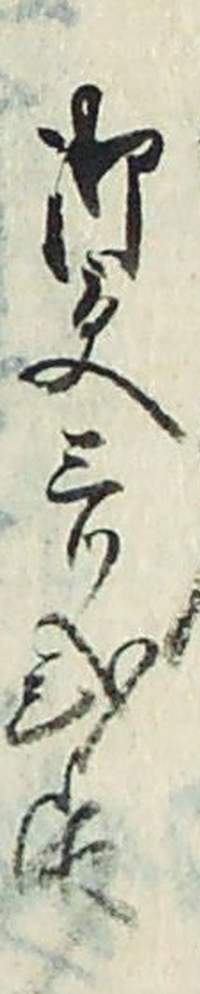御受三ツ弐歩
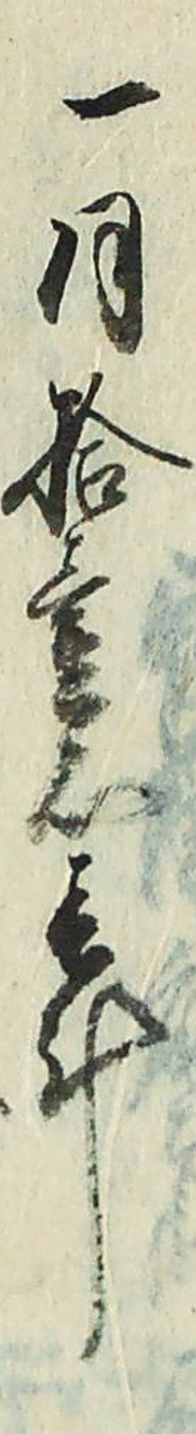一同拾壱石壱斗
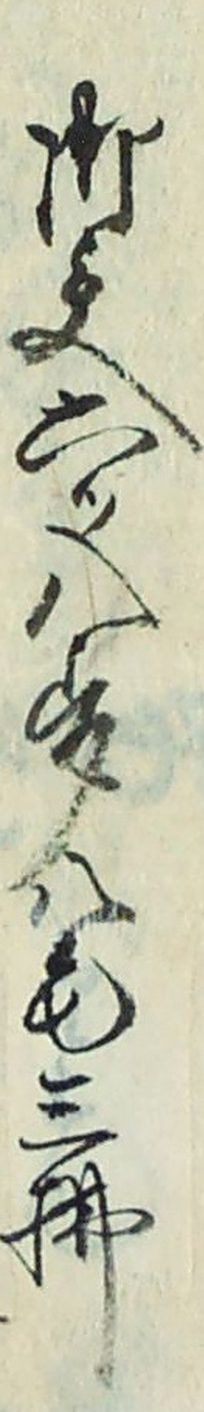御受六ツ八歩八毛三拂
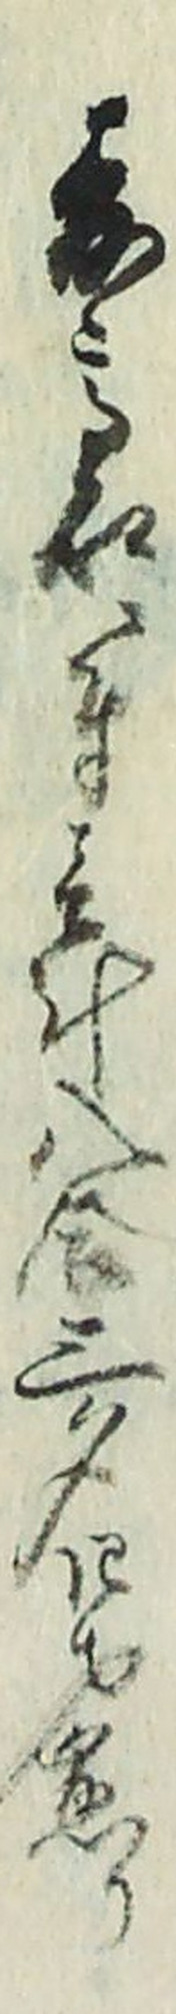表高石ニ付壱斗八合三勺四才懸り
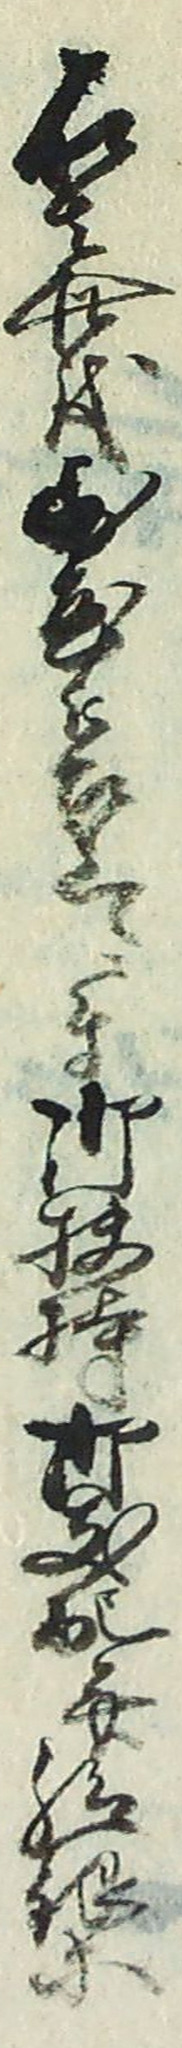右者此度歩懸被召上候ニ付御扶持御支配幷給銀等
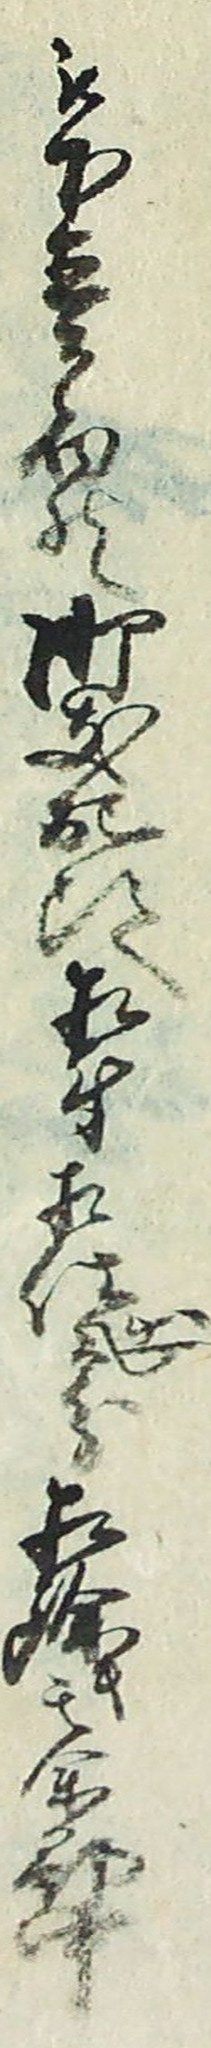被下置候者共御支配頭へ相付相仕出候分相除キ其余郡中
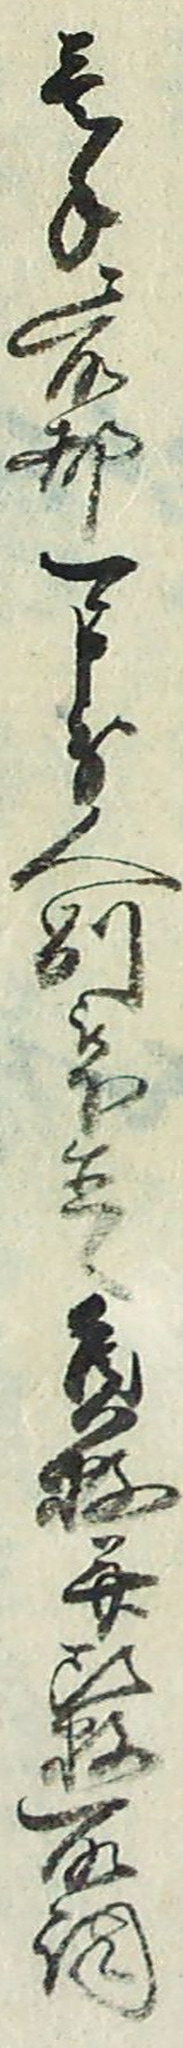壱手ニ取都可申分人別被下置候員数幷頭数取調
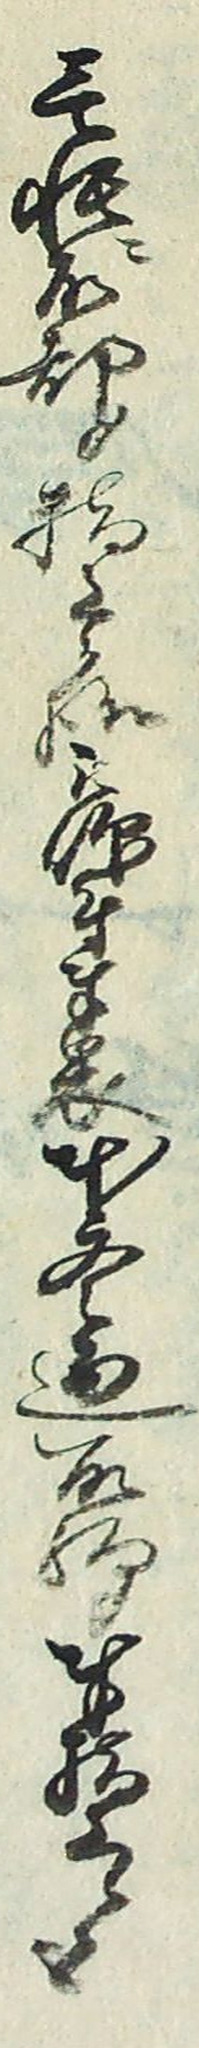壱帳ニ取都メ指上候様被仰付奉畏本文之通取都メ奉指上候以上

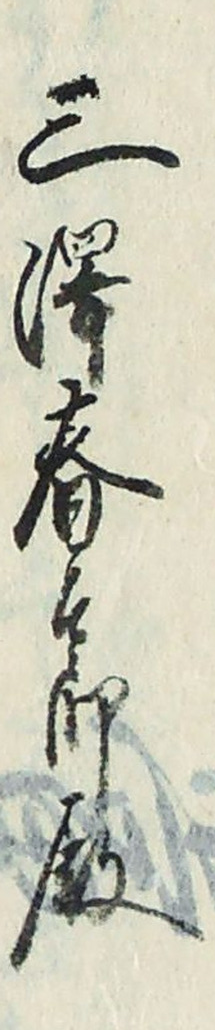三澤春太郎殿
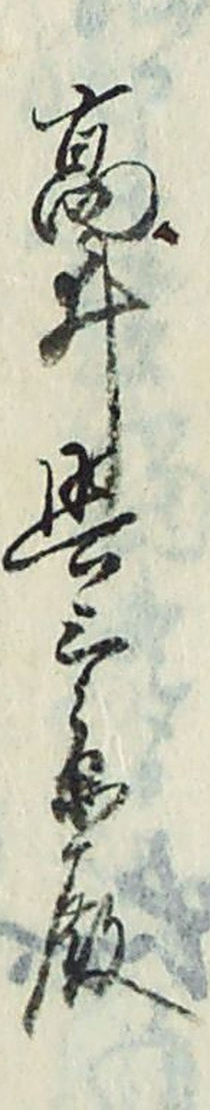高井與三兵衛殿
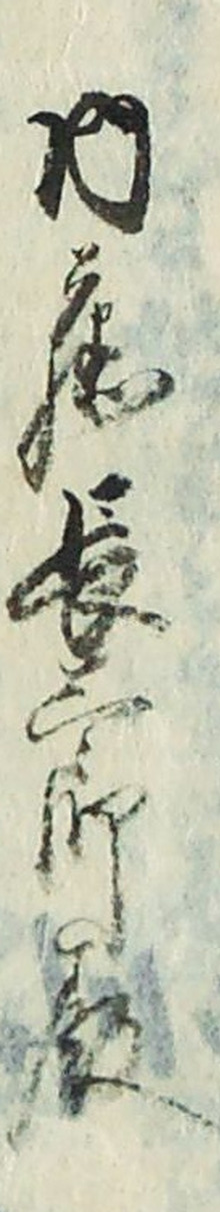内藤長三郎殿
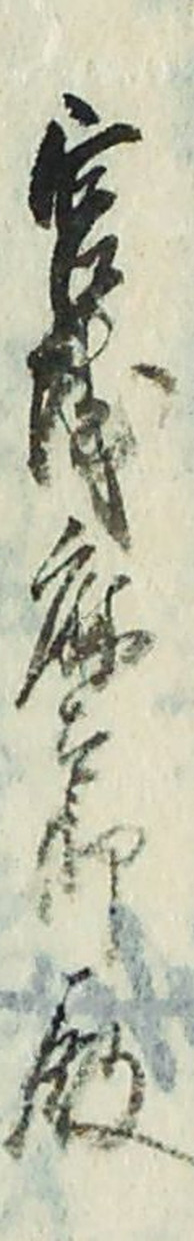宮城麻太郎殿
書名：諸御趣意書并御下知向之写
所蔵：鳴門教育大学 Naruto University of Education
